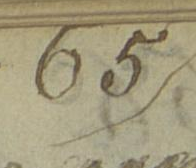65
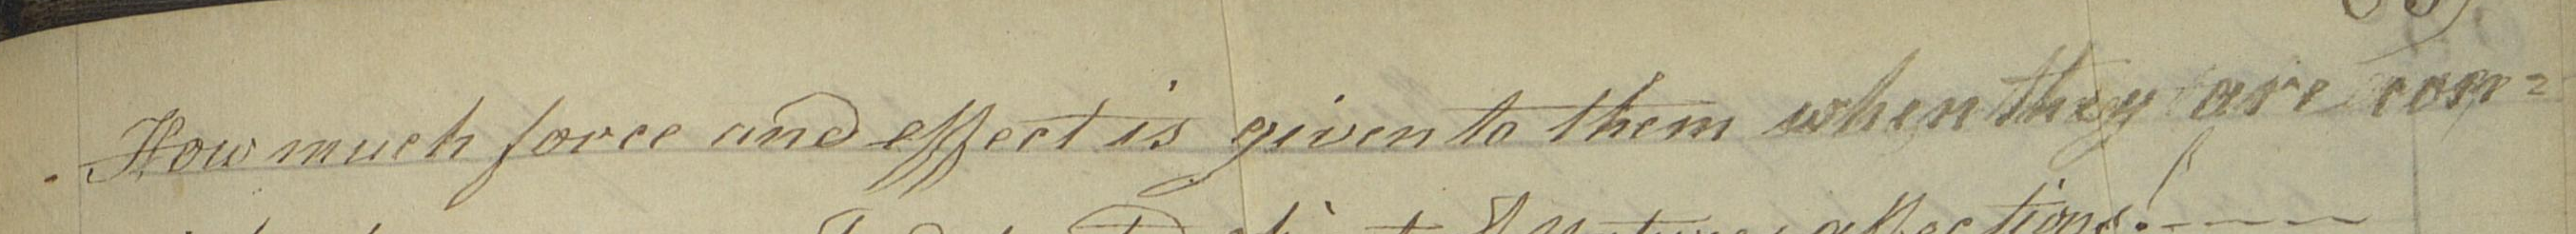How much force and effect is given to them when they are con-
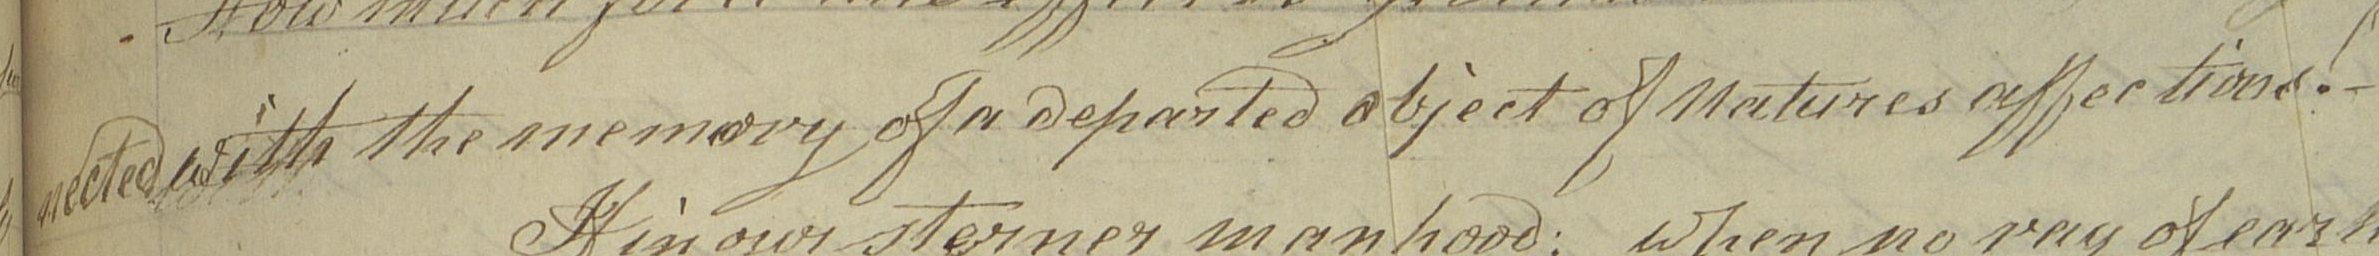-nected with the memory of a departed object of Natures affections.
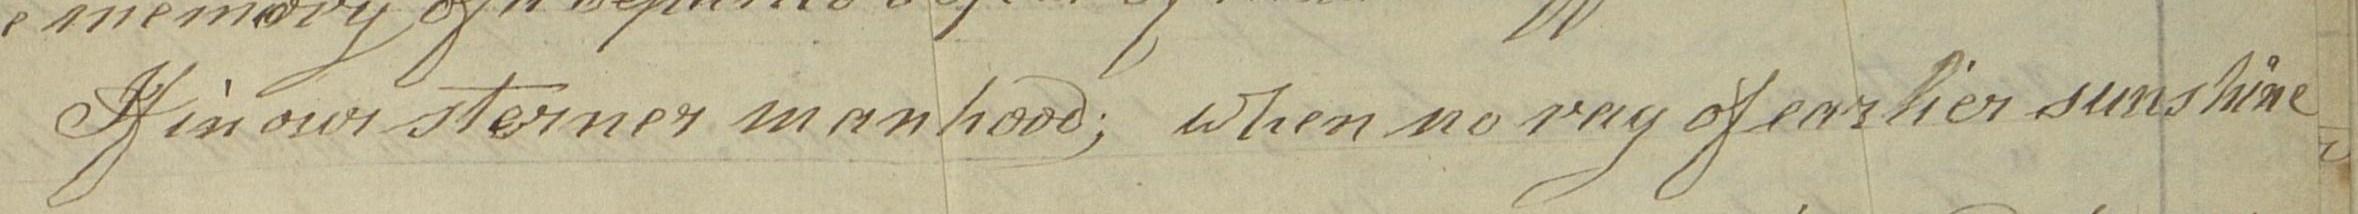If in our sterner manhood; when no ray of earlier sunshine
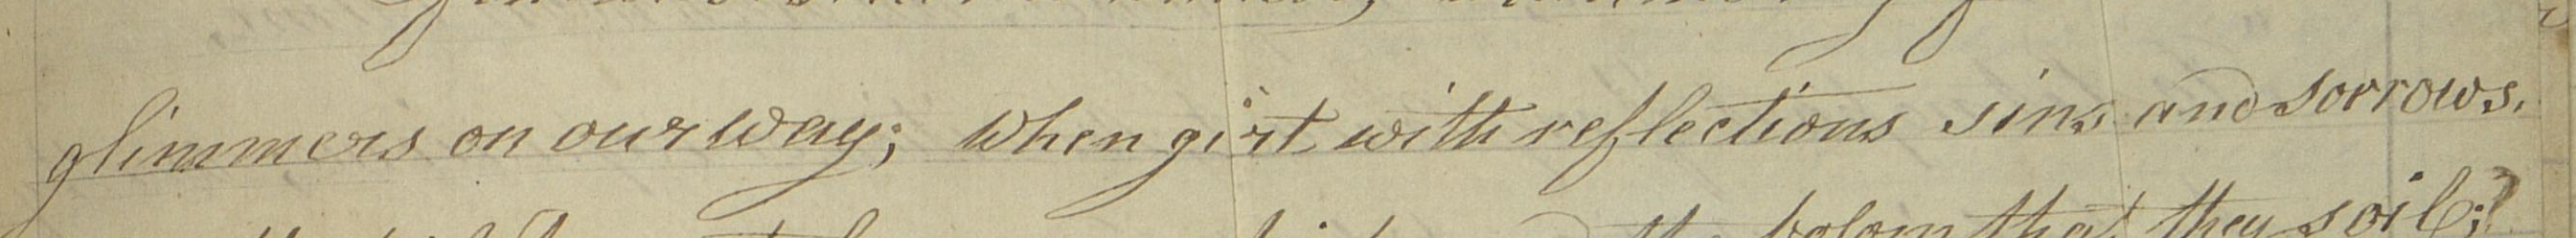glimmers on our way; when girt with reflections sins and Sorrows,
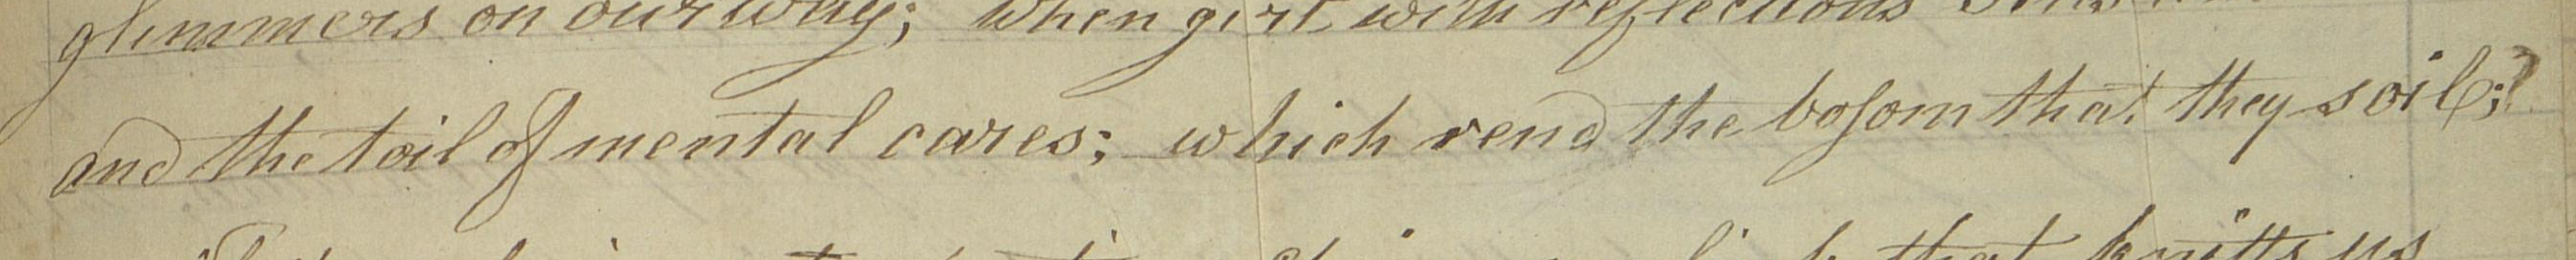and the toil of mental cares; which rend the bosom that they soil;
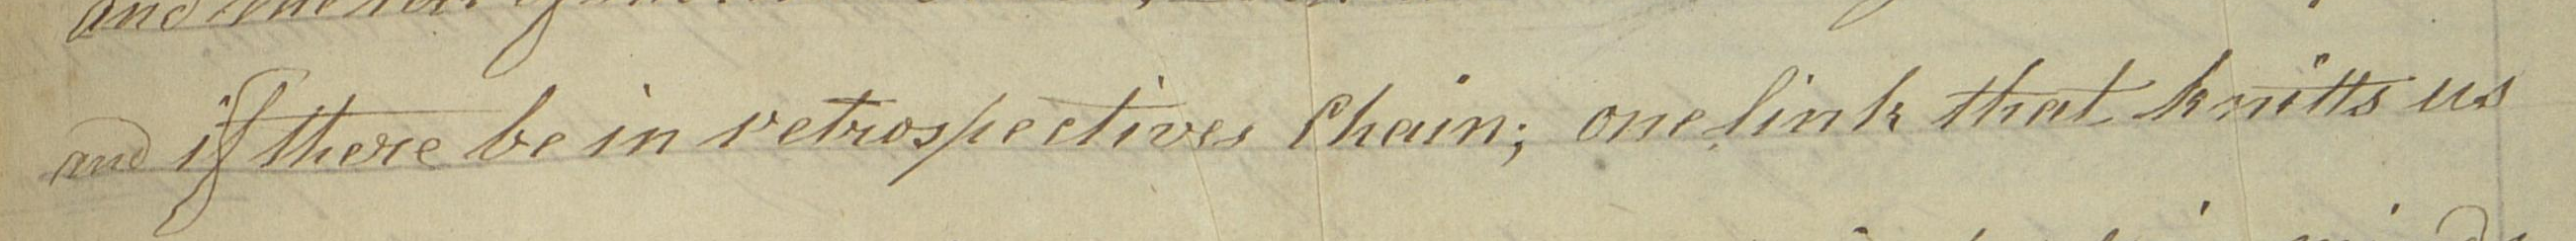and if there be in retrospective chain; one link that knitts us
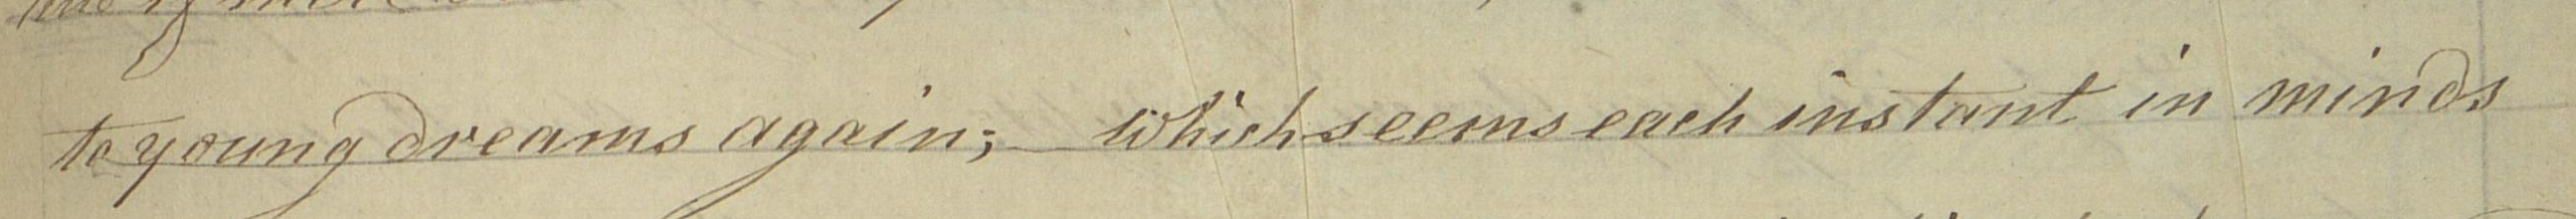to young dreams again; which seems each instant in minds
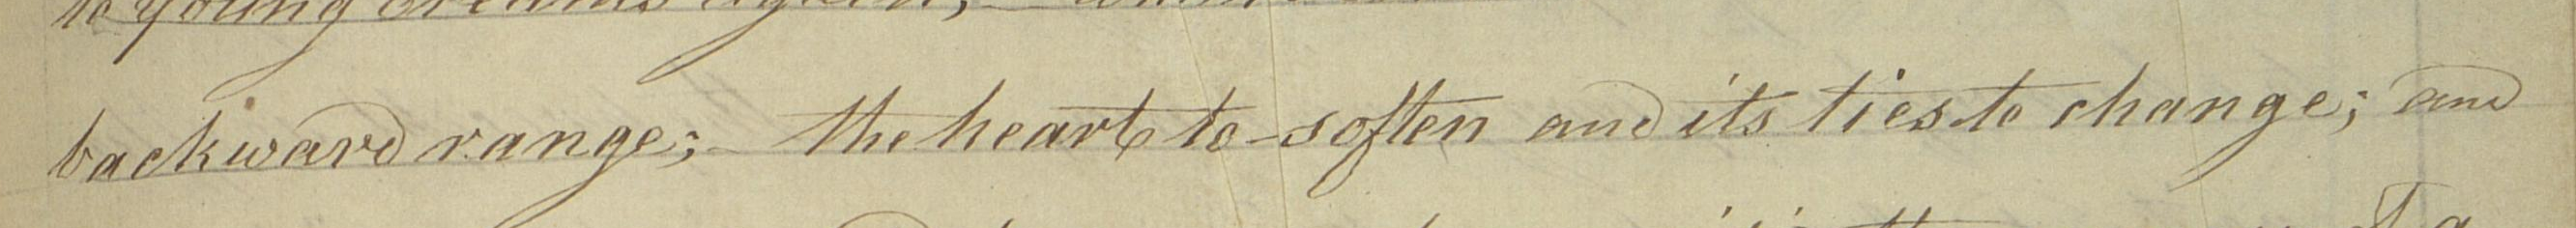backward range; the heart to soften and its ties to change; and
